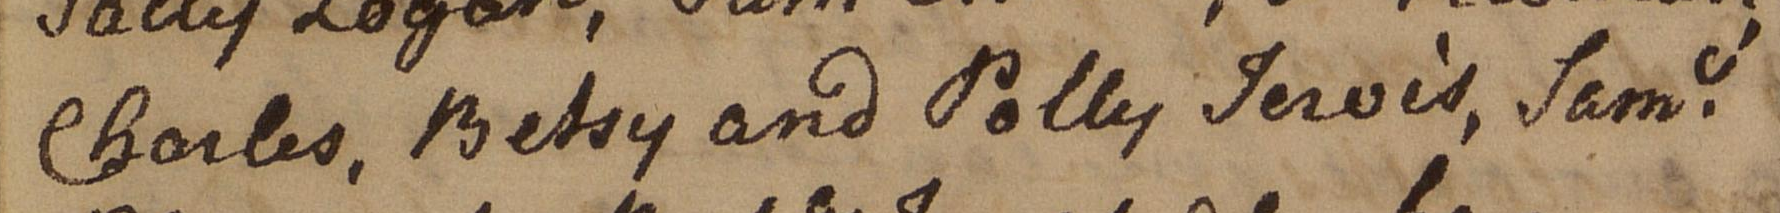Charles, Betsy and Polly Jervis, Sam^l.
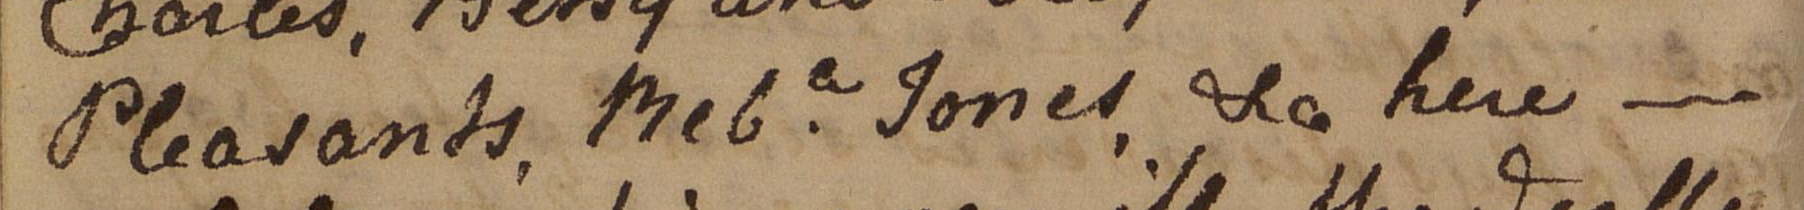Pleasants, Reb^a. Jones, &c here-
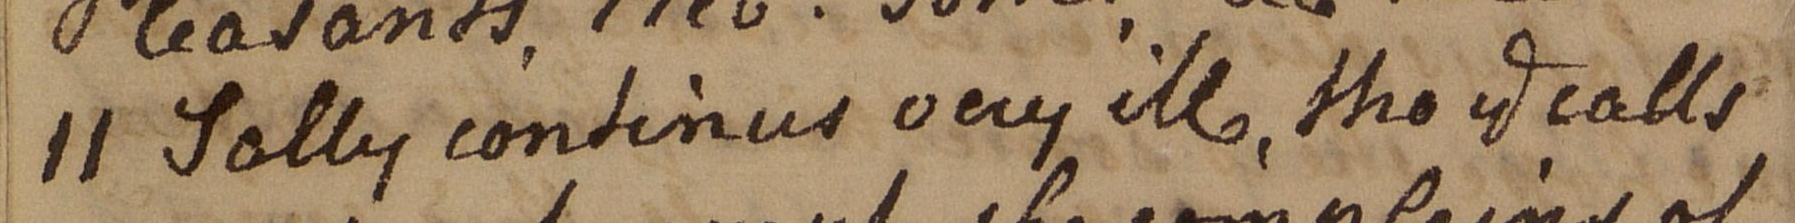11 Sally continus very ill, tho y^e calls
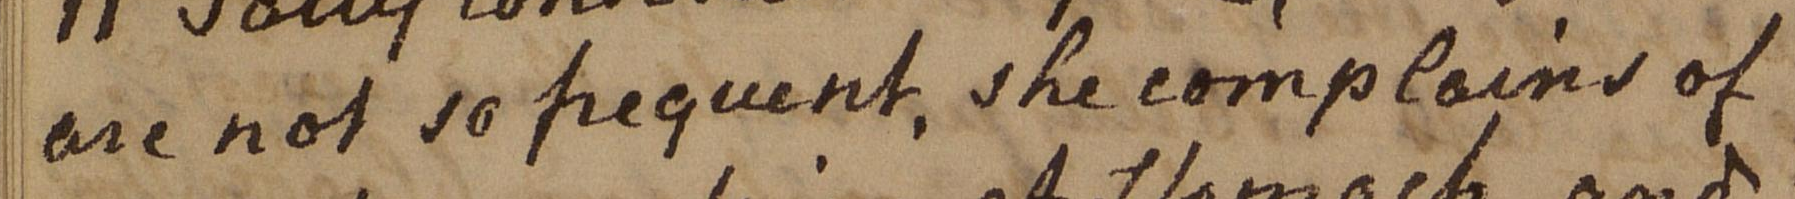are not so frequent, she complains of
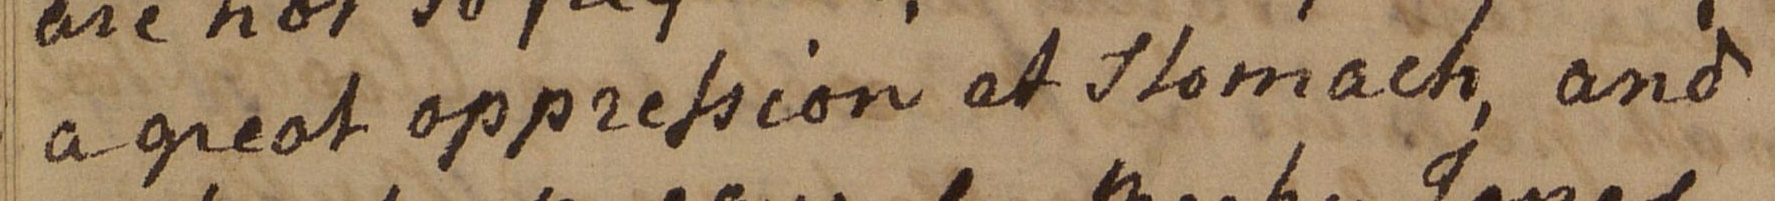a great oppression at Stomach, and
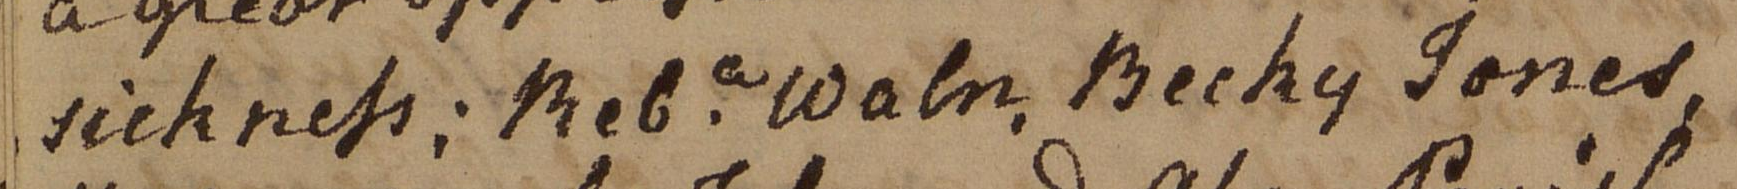sickness, Reb^a. Waln, Becky Jones,
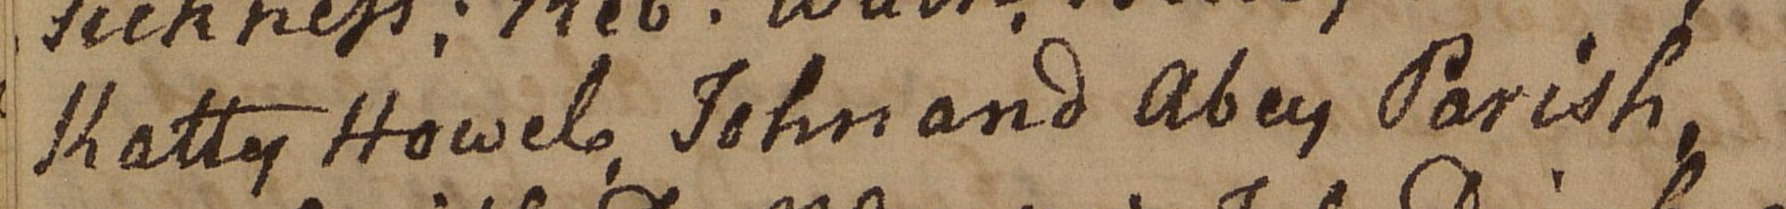Katty Howel, John and Abey Parish,
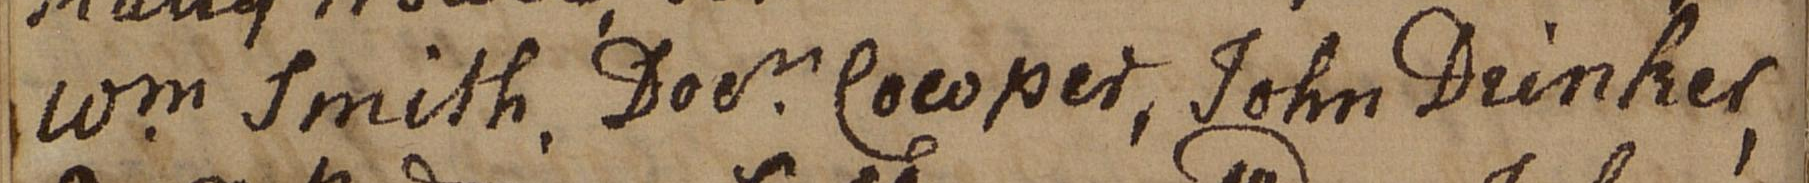W^m. Smith, Doc^r. Cowper, John Drinker,
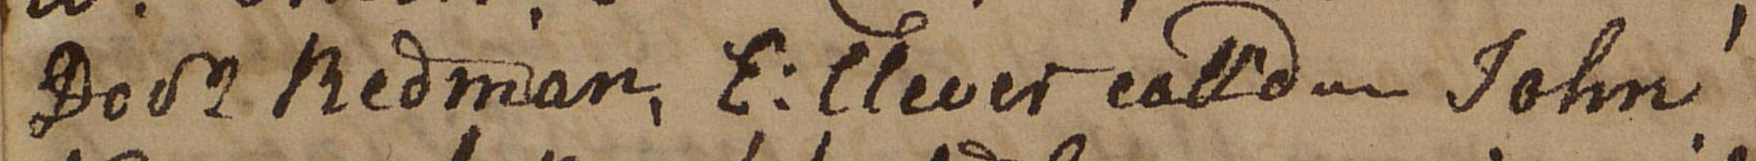Doc^r. Redman, E: Clever call'd- John
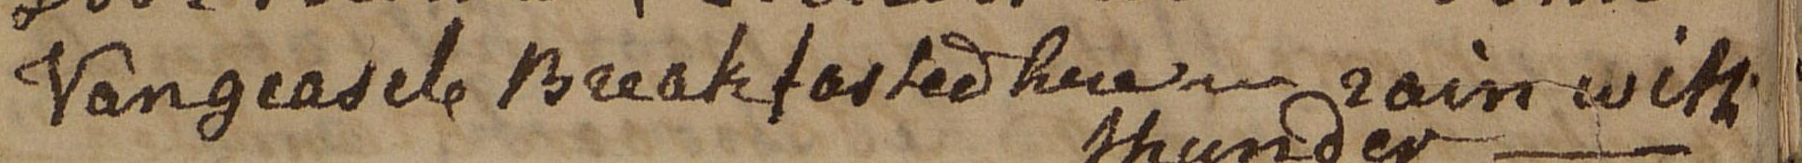Vangeasel Breakfasted here- rain with
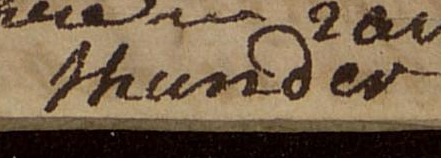thunder
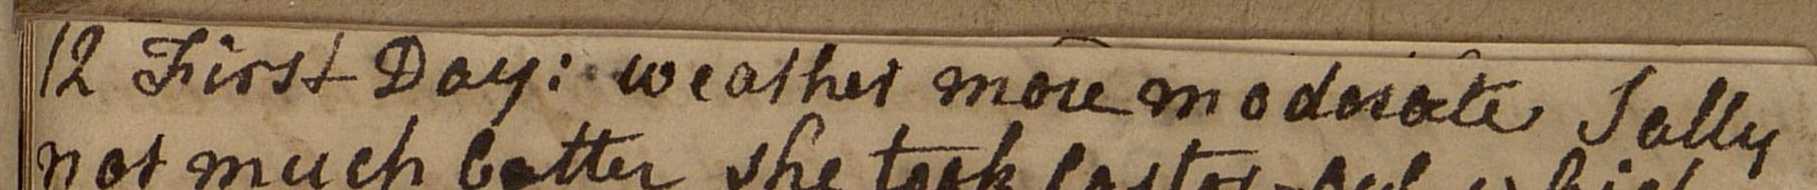12 First Day: weather more moderate Sally
